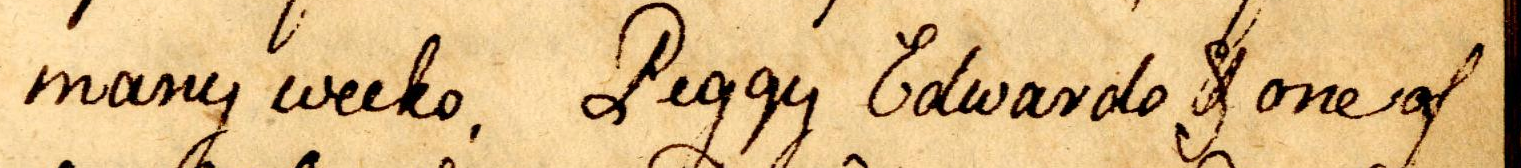many weeks, Peggy Edwards & one of
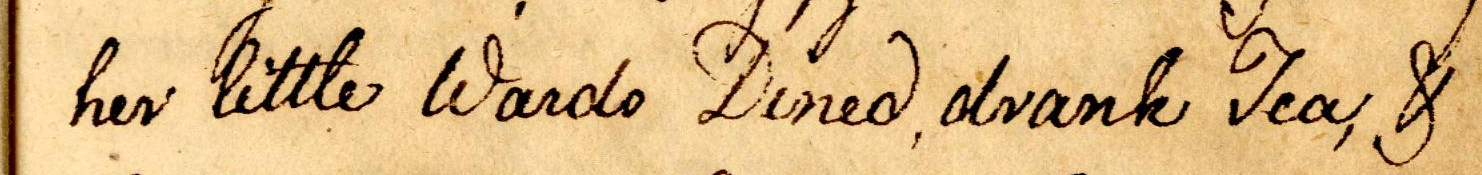her little Wards Dined, drank Tea, &
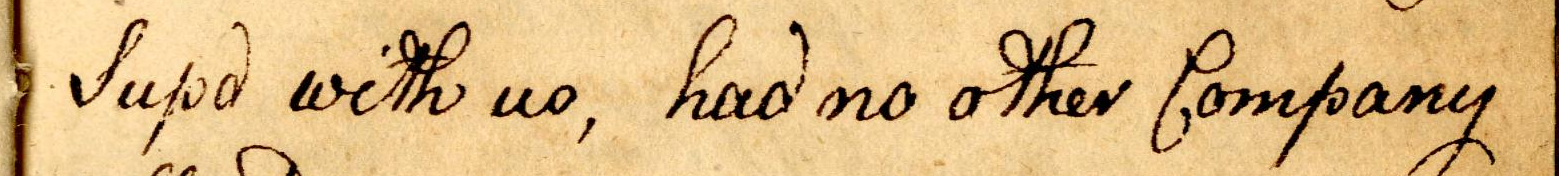Supd with us, had no other Company
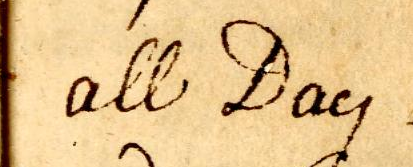all Day
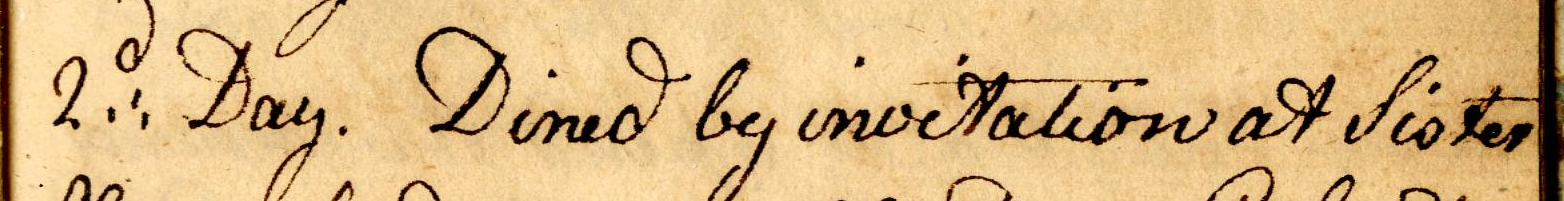2^d Day. Dined by invitation at Sister
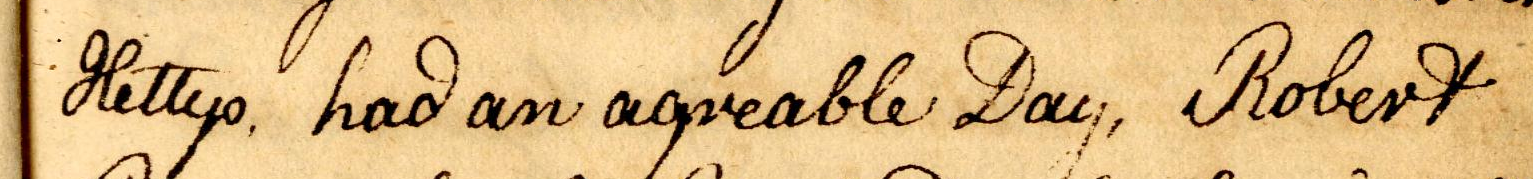Hettys, had an agreable Day, Robert
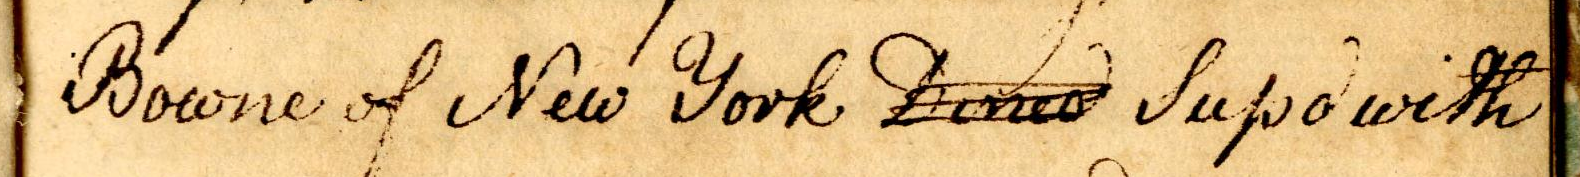Bowne of New York [Dined] Supd with
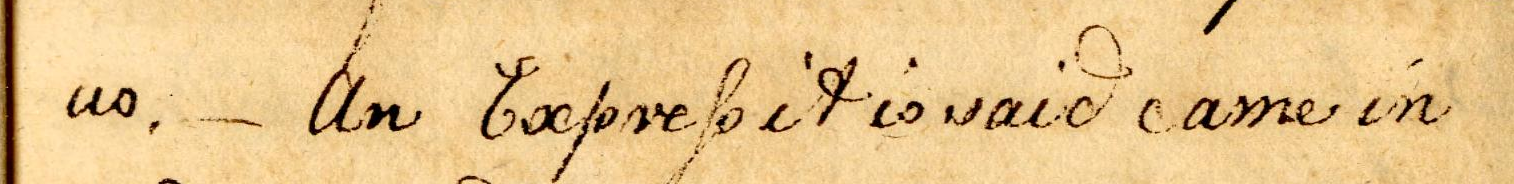us.- An Express it is said came in
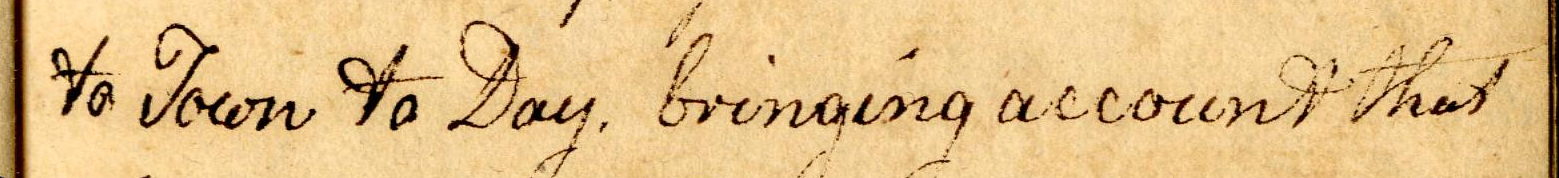to Town to Day, bringing account that
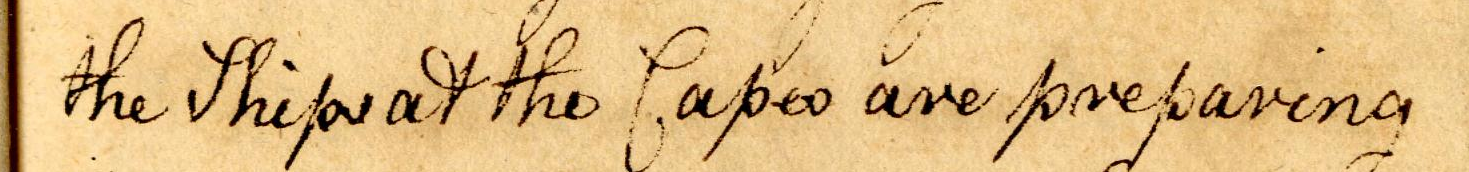the Ships at the Capes are preparing
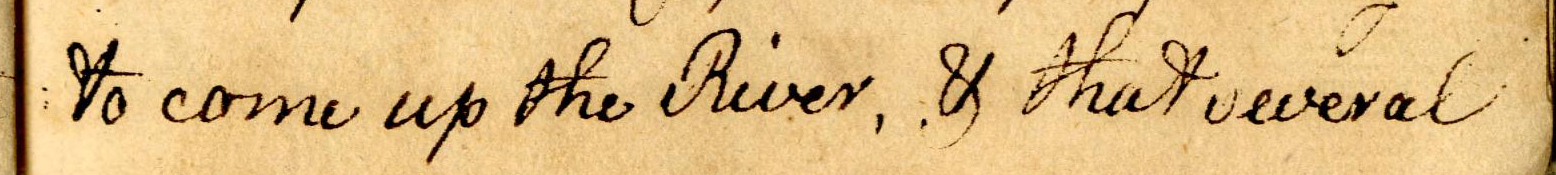to come up the River, & that several
